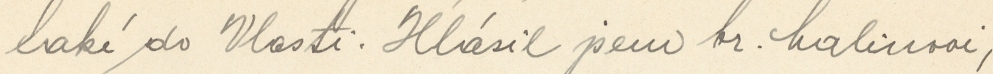také do vlasti. Hlásil jsem br. Malinovi,
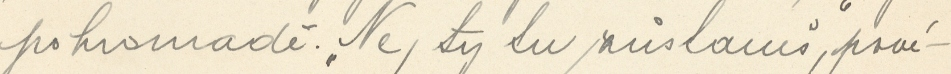pohromadě. „Ne, ty tu zůstaneš,“ poví-
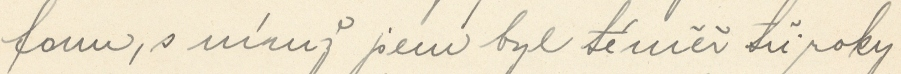fonu, s nímž jsem byl téměř tři roky
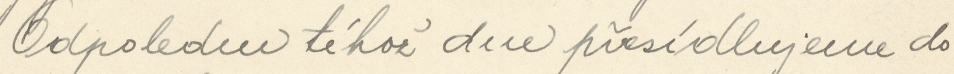Odpoledne téhož dne přesídlujeme do
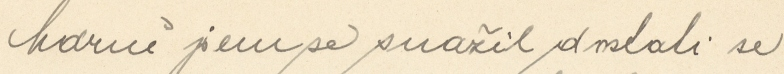Marně jsem se snažil dostati se
